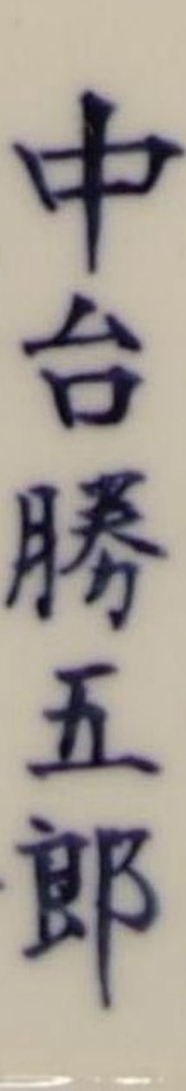中台勝五郎
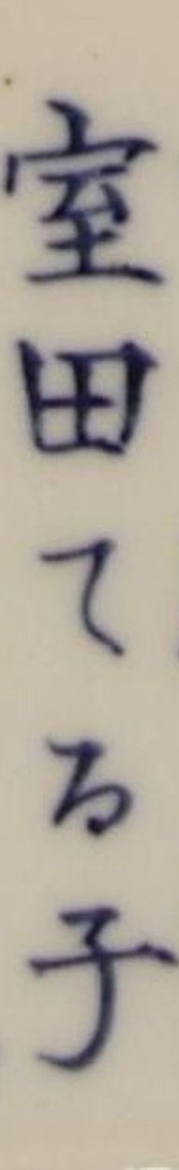室田てる子
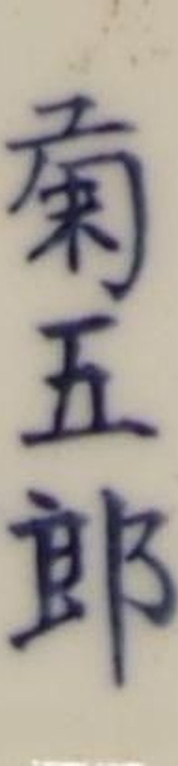菊五郎
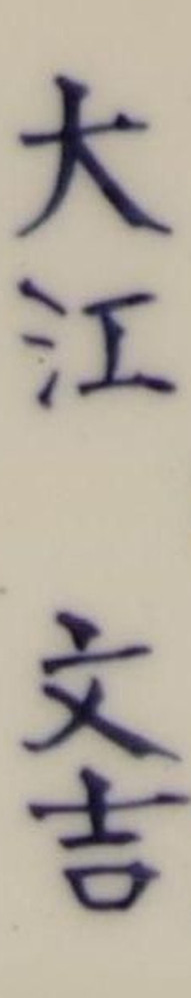大江文吉
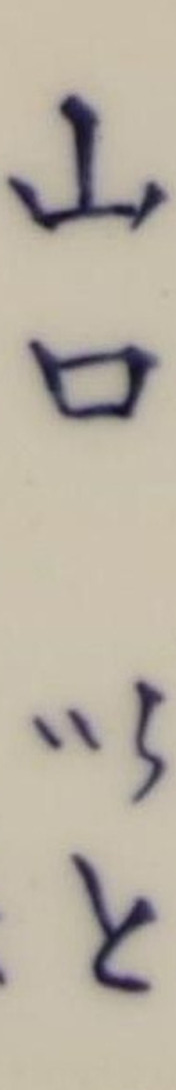山口いと
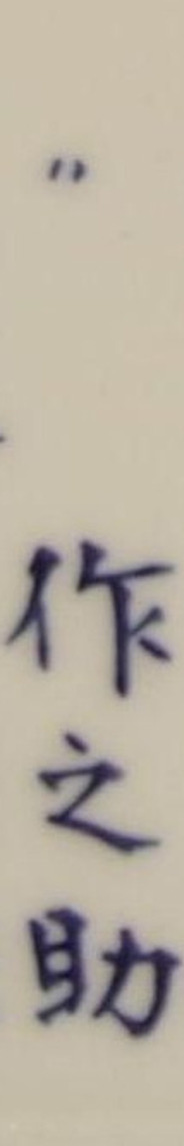作之助
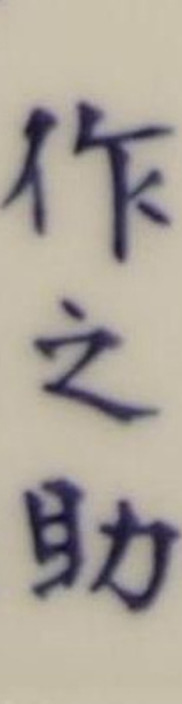作之助
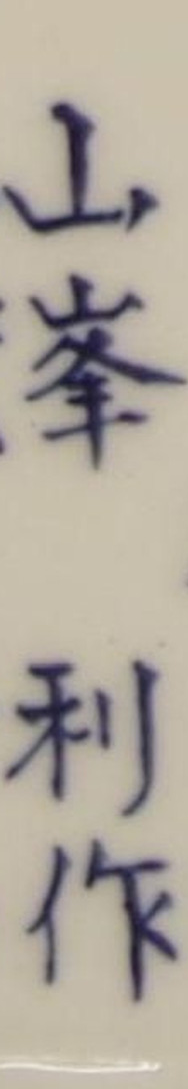山峯利作
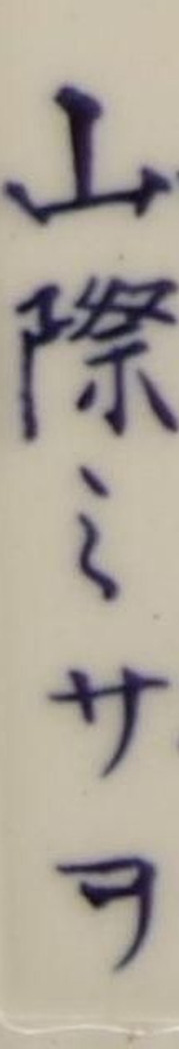山際ミサヲ

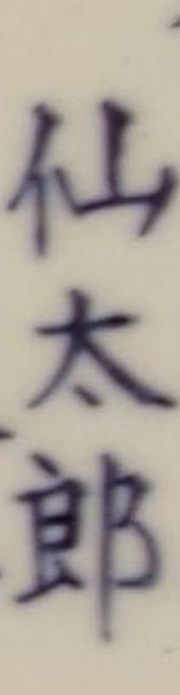仙太郎
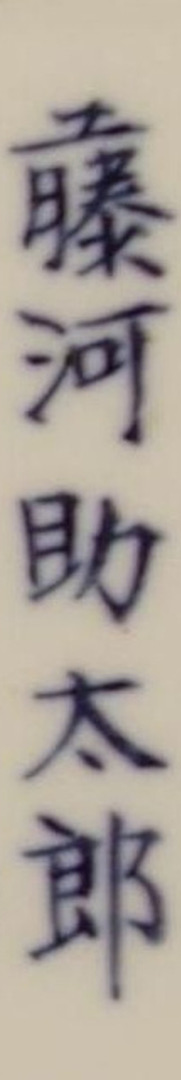藤河助太郎
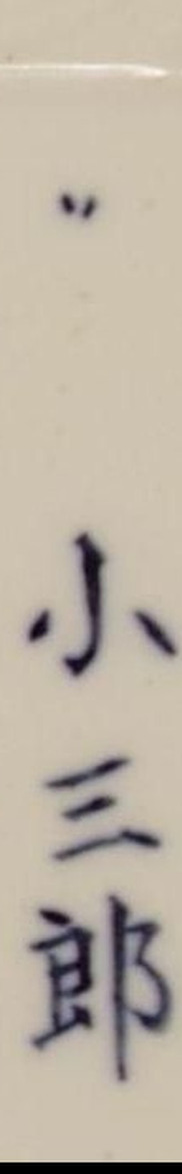小三郎
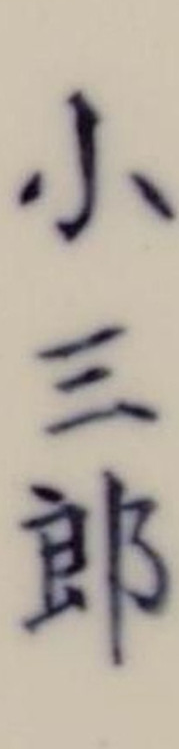小三郎
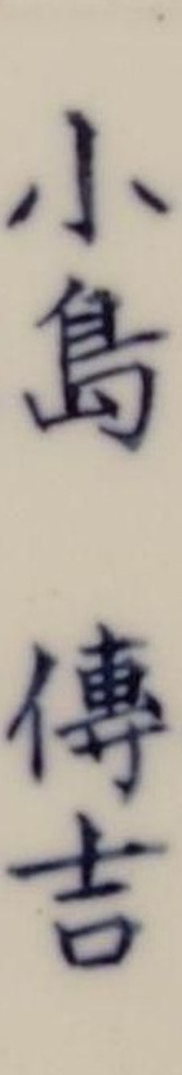小島傳吉
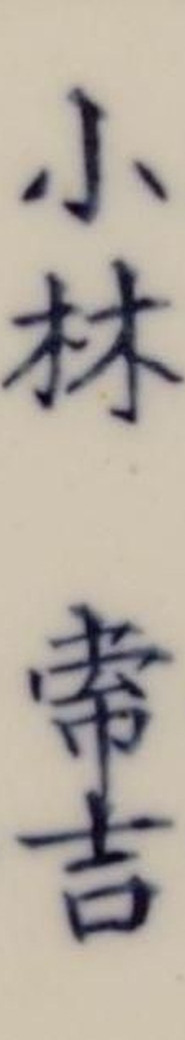小林常吉
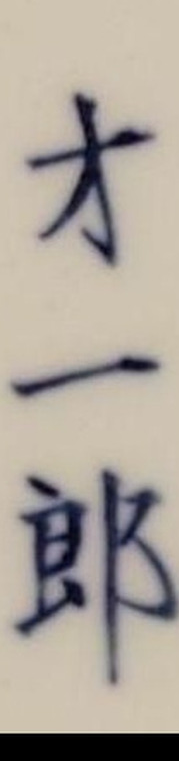才一郎
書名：E~L
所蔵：高野山金剛峯寺
